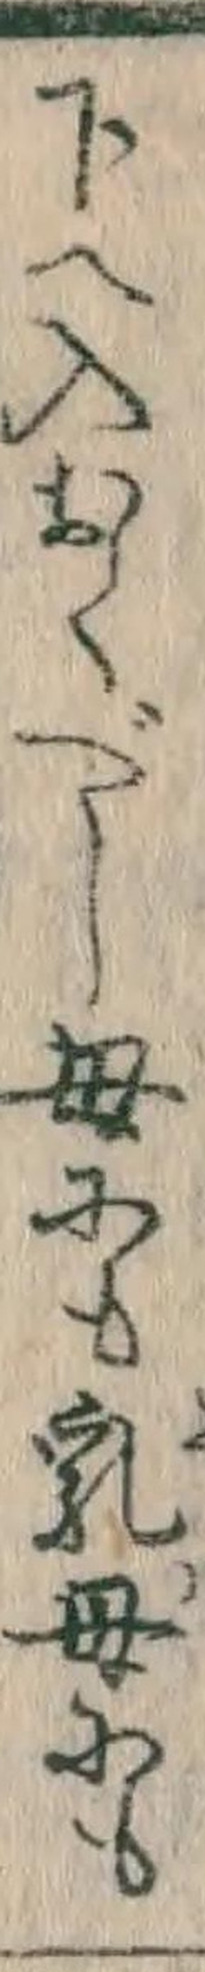下へ入おくべし母にも乳母にも
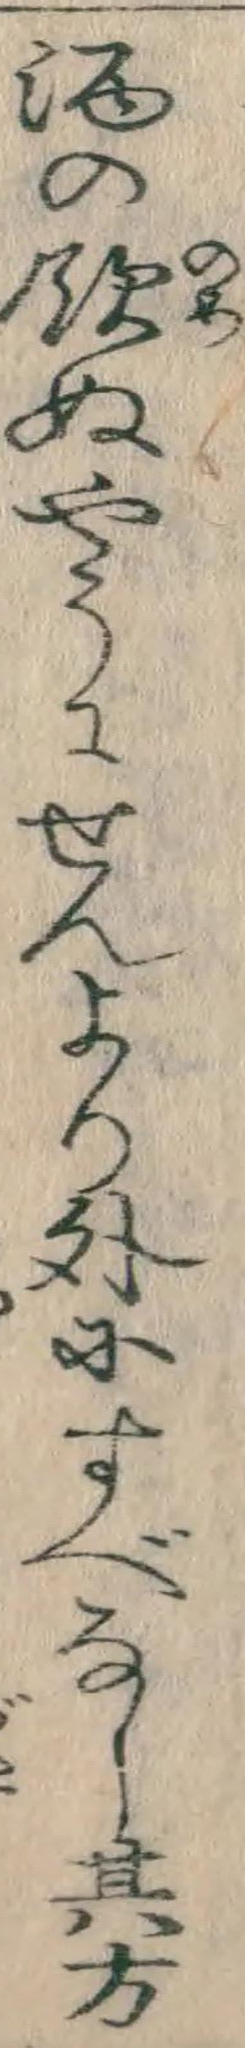酒の飲ぬやうにせんより外にすべなし其方
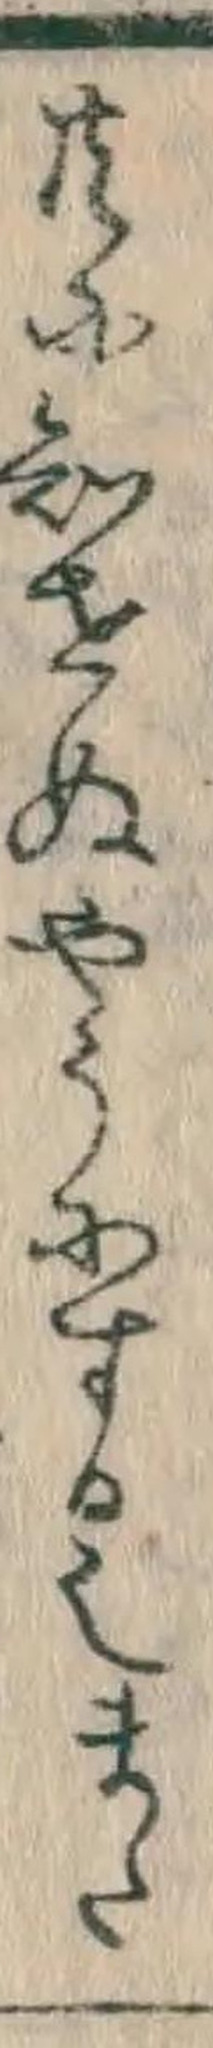共に知せぬやうにする也また
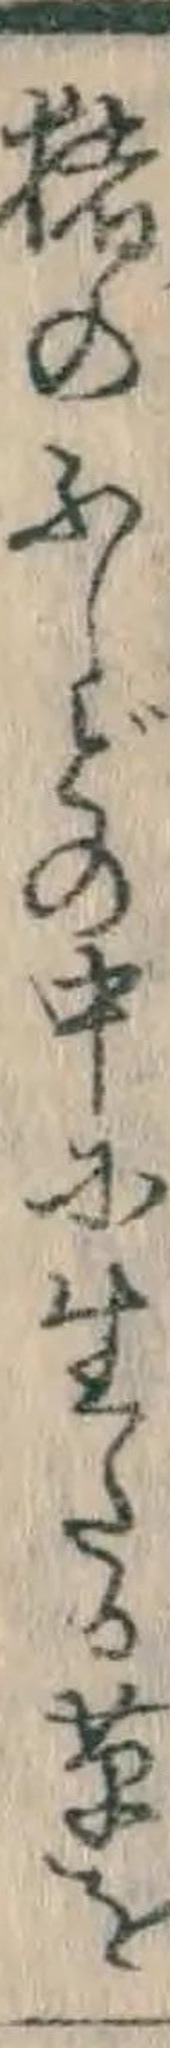猪のふしどの中に生たる草を
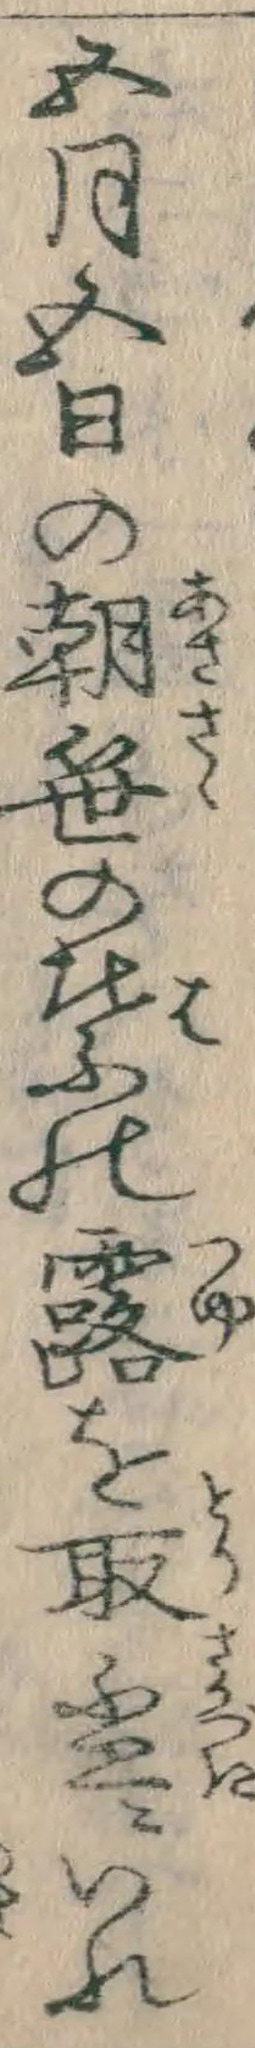五月五日の朝笹の葉の露を取盃にいれ
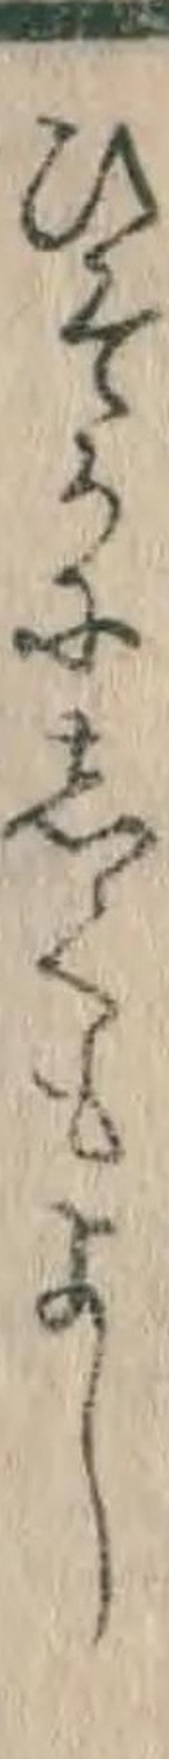ひそかにしくもよし
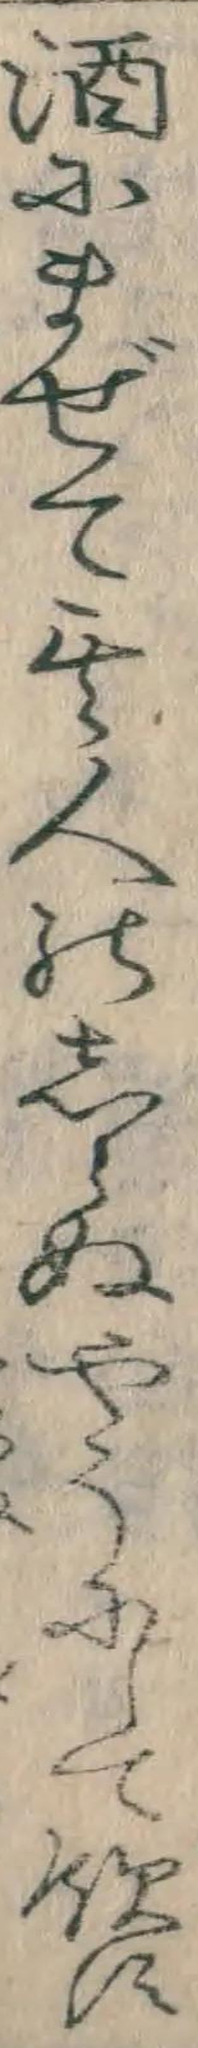酒にまぜて其人のしらぬやうにして飲す
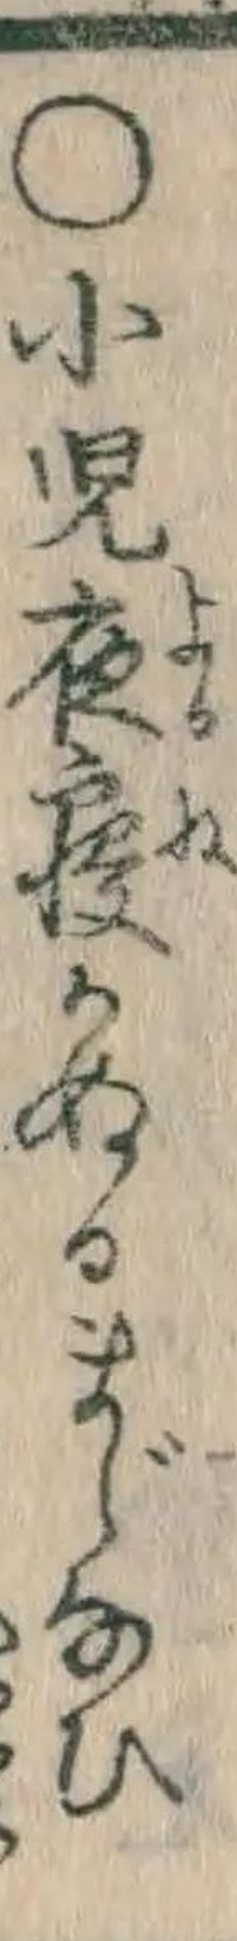○小児夜寝かぬるまじなひ
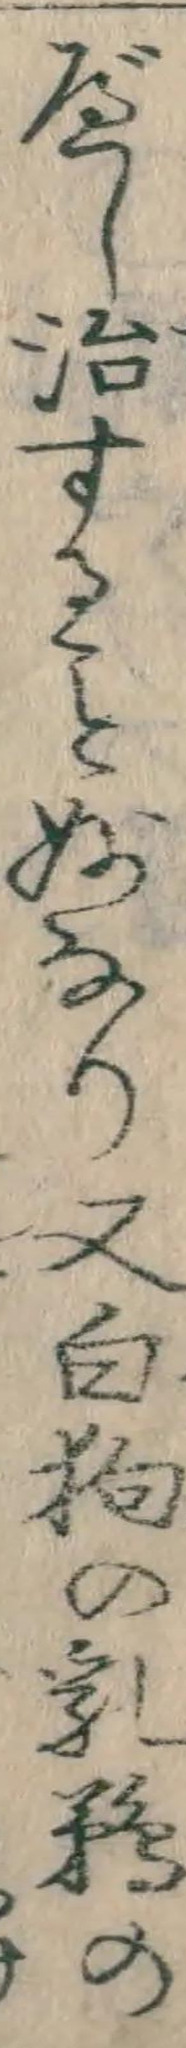べし治すること妙なり又白狗の乳鵜の
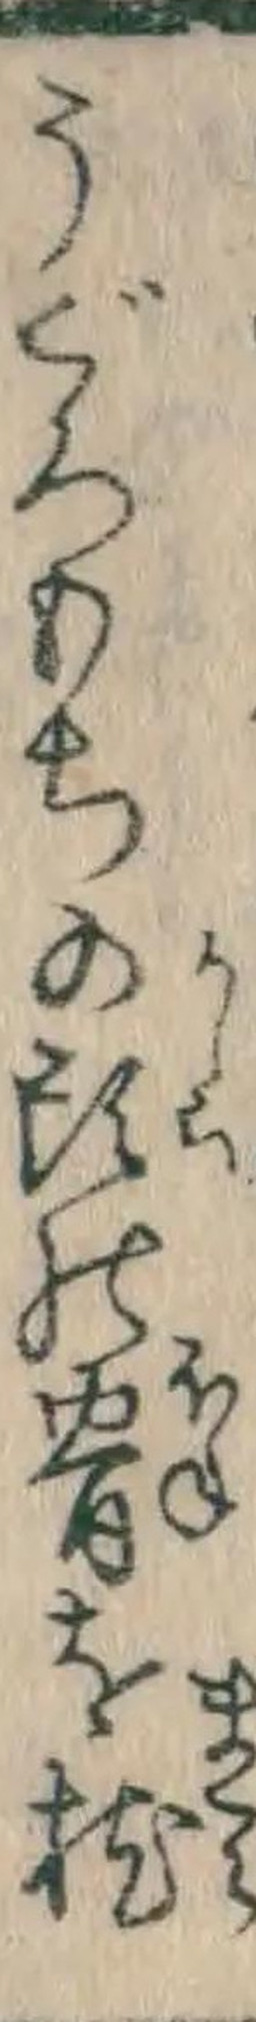うぐろもちの頭の骨を枕
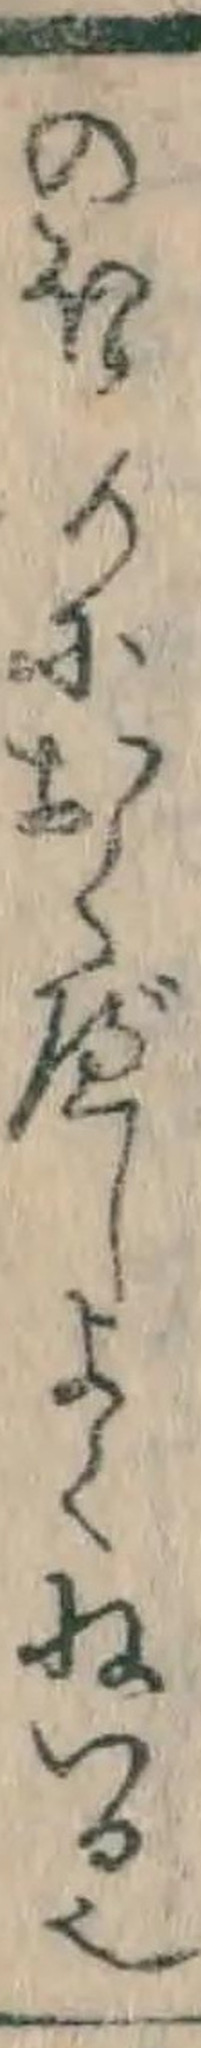のほ[と]りにおくべしよくねいる也
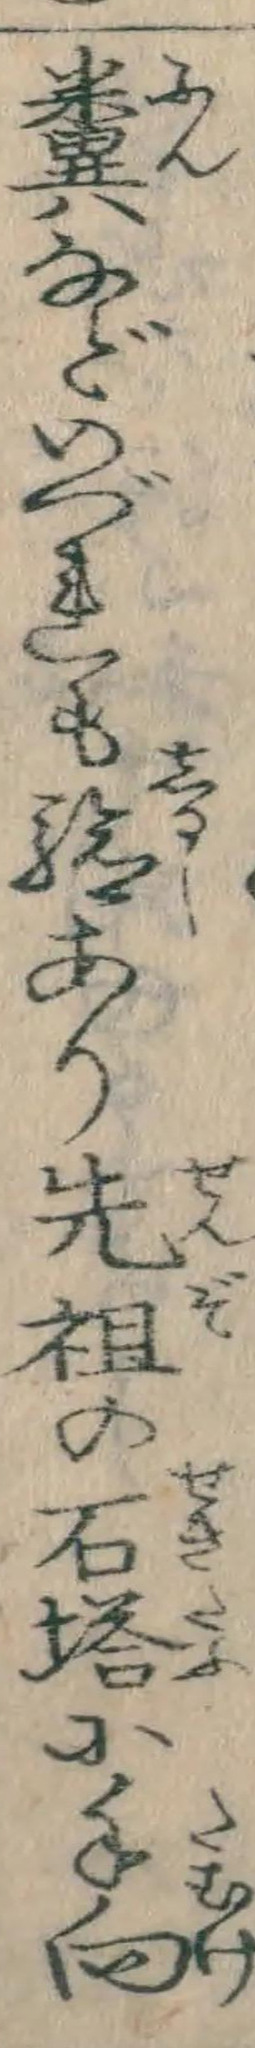糞などいづれも験あり先祖の石塔に手向

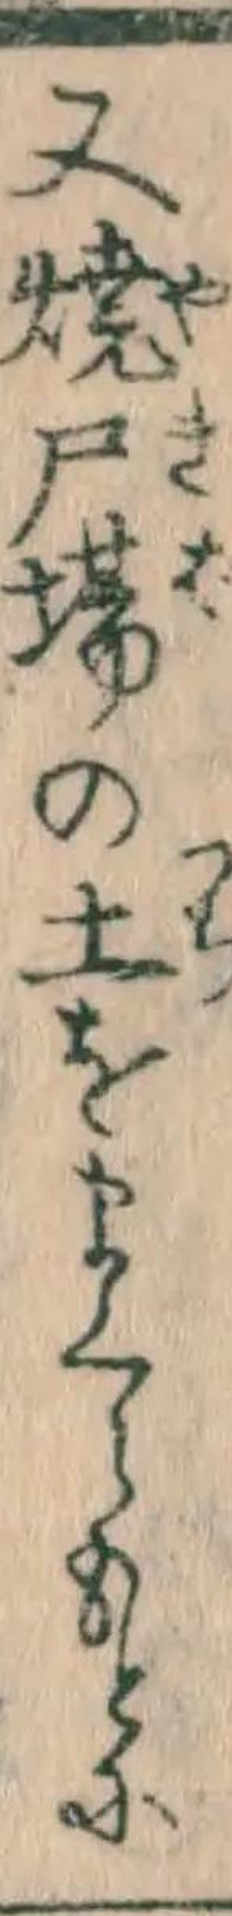又焼尸場の土をまくらもとに
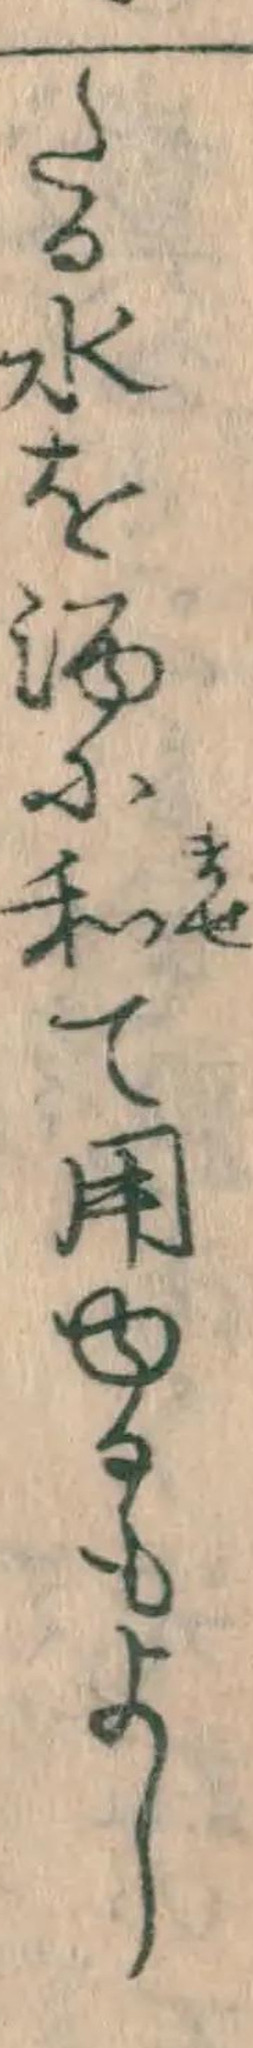たる水を酒に和て用ゆるもよし
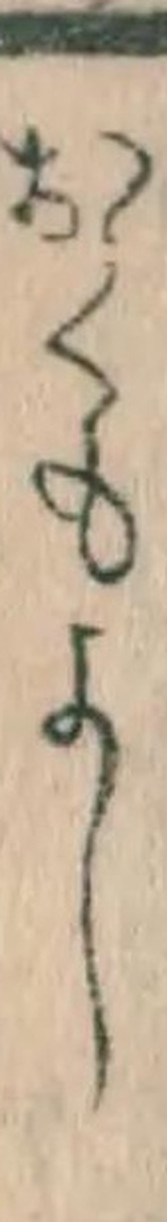おくもよし
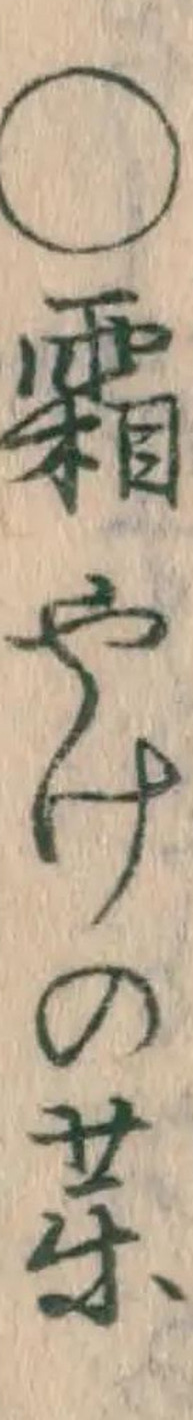○霜やけの薬
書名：広益秘事大全 3巻. [4]
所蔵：国立国会図書館 National Diet Library, JAPAN
